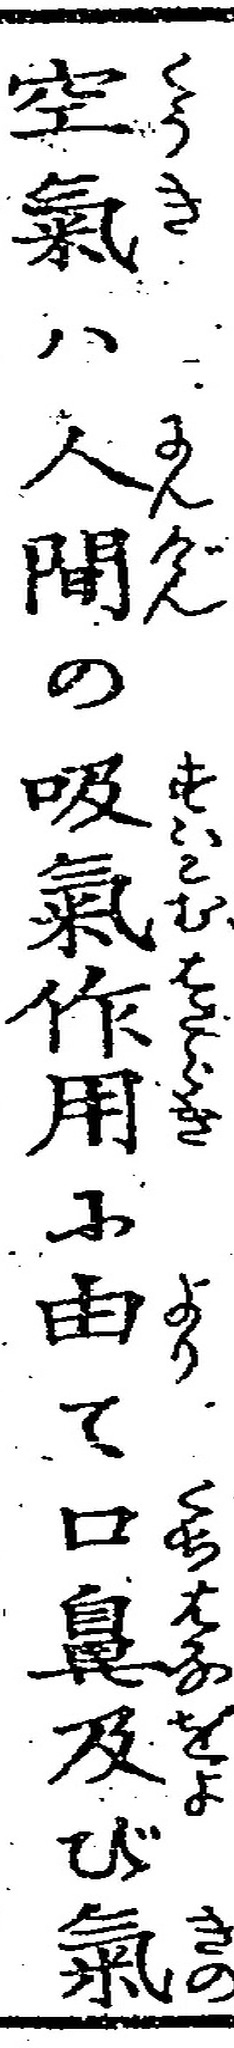空気は人間の吸気作用に由て口鼻及び気
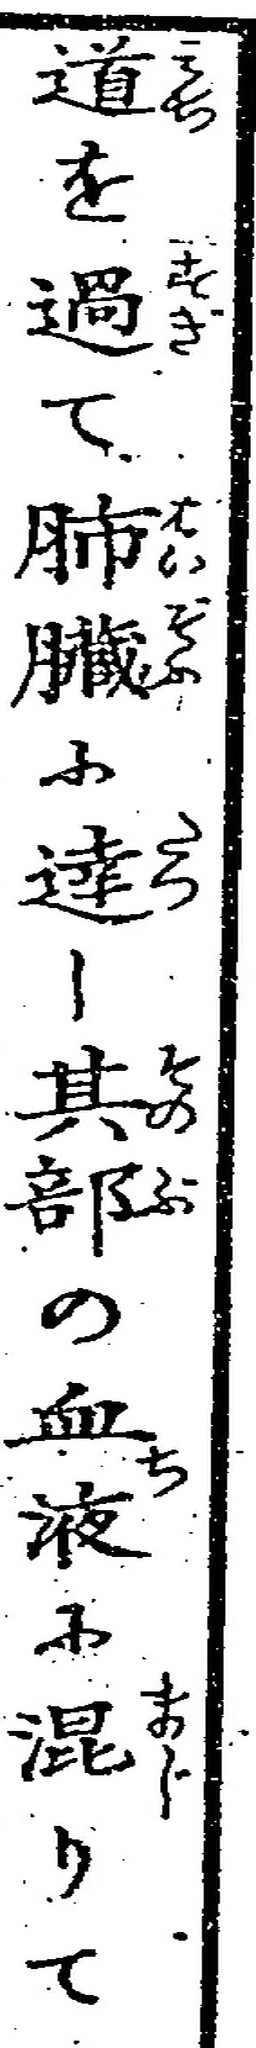道を過て肺臓に達し其部の血液に混りて
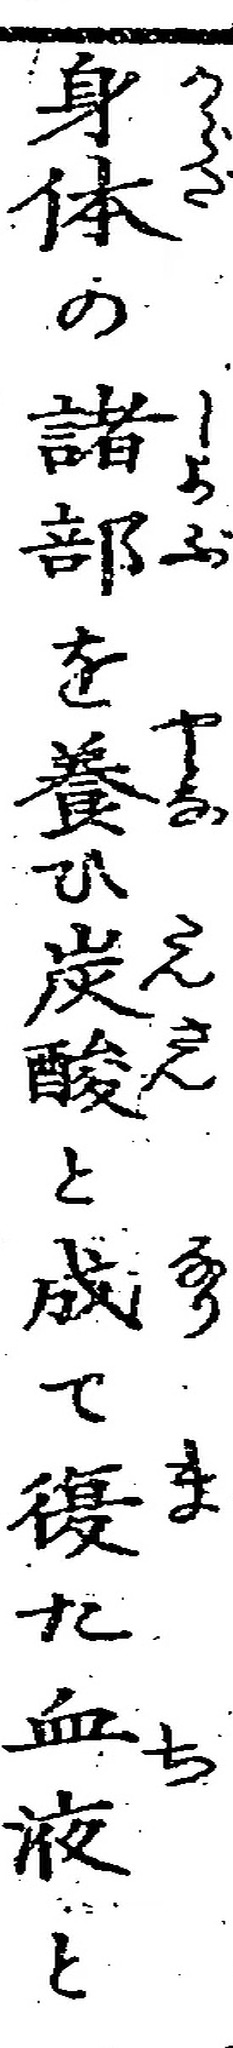身体の諸部を養ひ炭酸と成て復た血液と
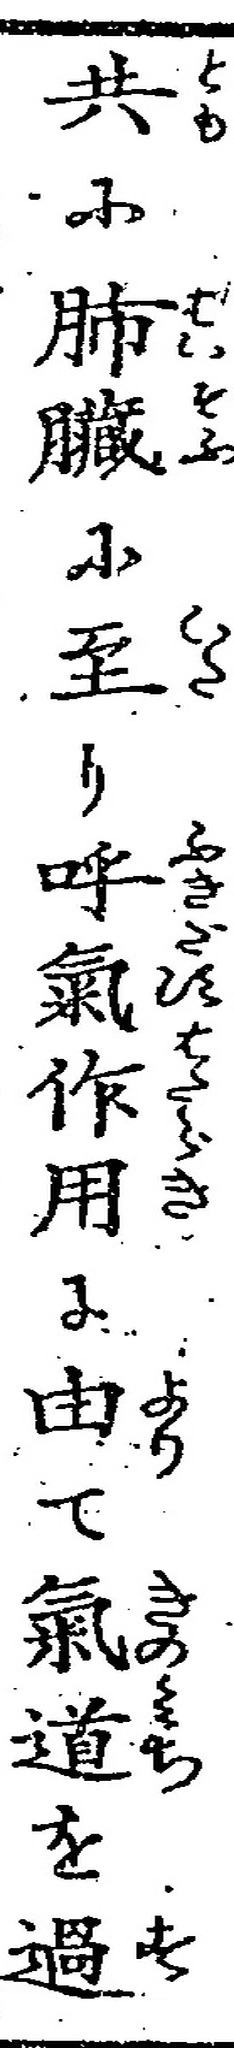共に肺臓に至り呼気作用に由て気道を過
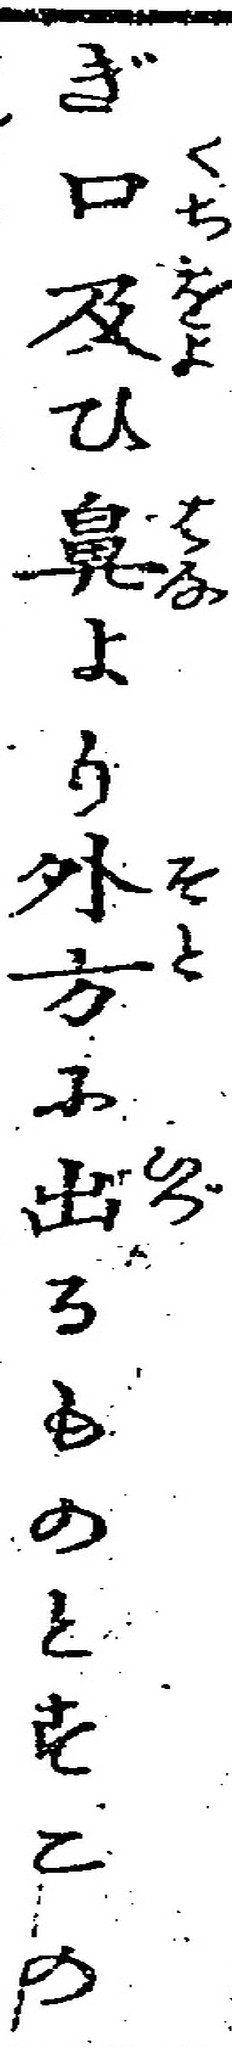ぎ口及ひ鼻より外方に出るものとすこの
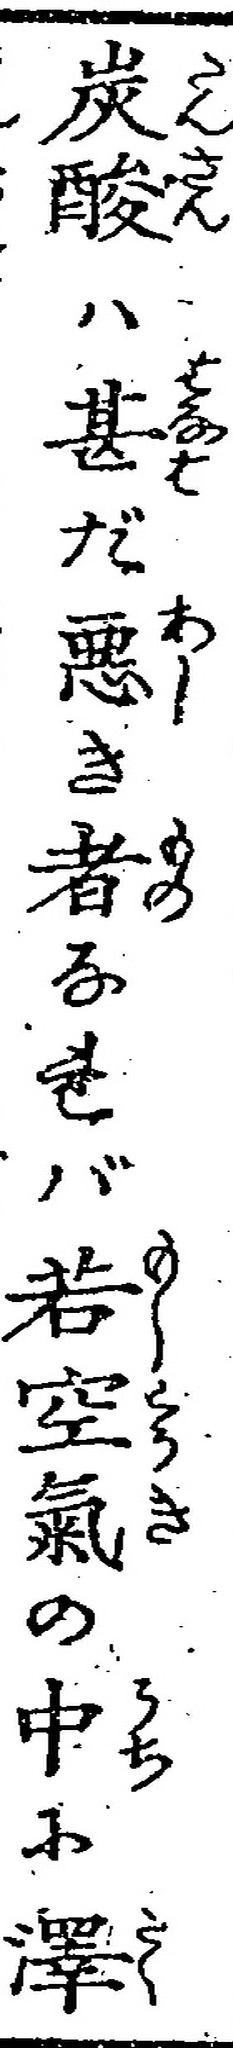炭酸は甚だ悪き者なれば若空気の中に沢
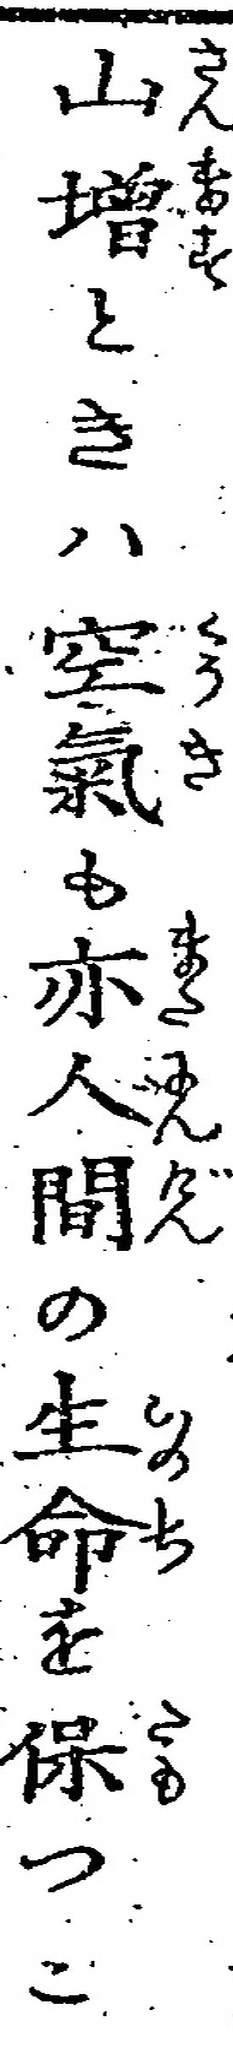山増とき空気も亦人間の生命を保つこ
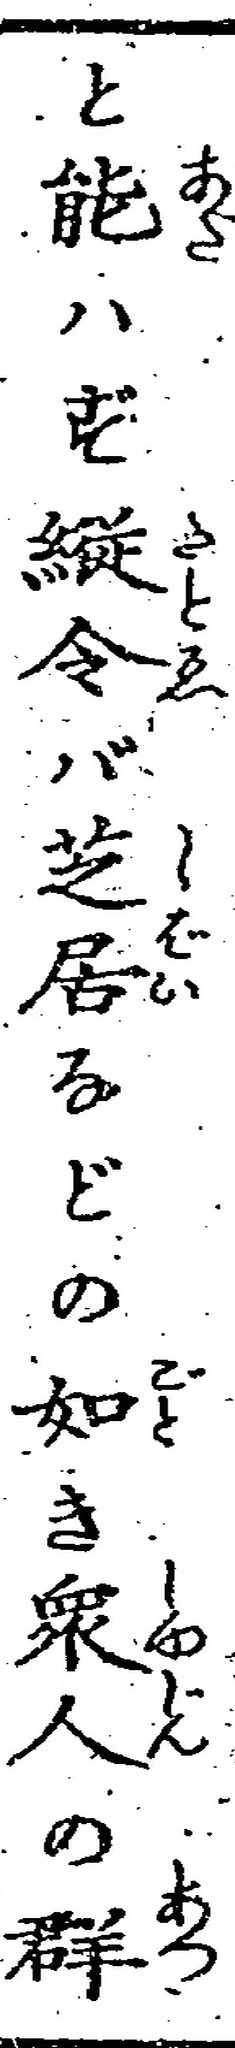と能はず縦令ば芝居などの如き衆人の群
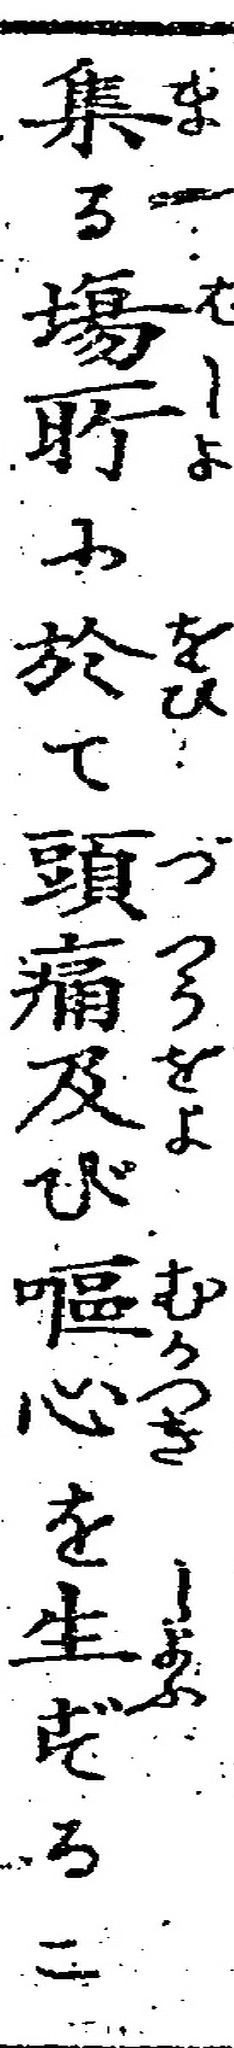集る場所に於て頭痛及び嘔心を生ずるこ

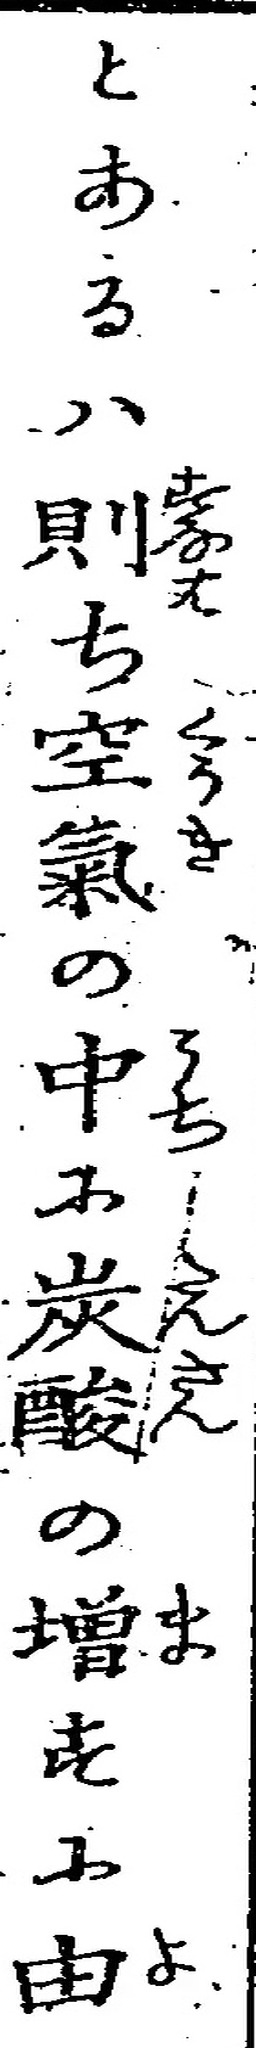とあるは則ち空気の中に炭酸の増すに由
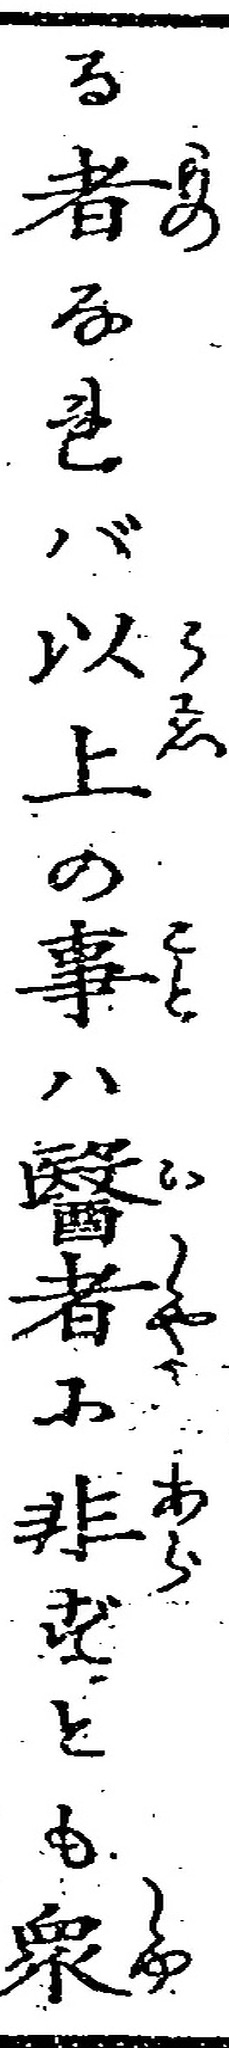る者なれば以上の事は医者に非ずとも衆
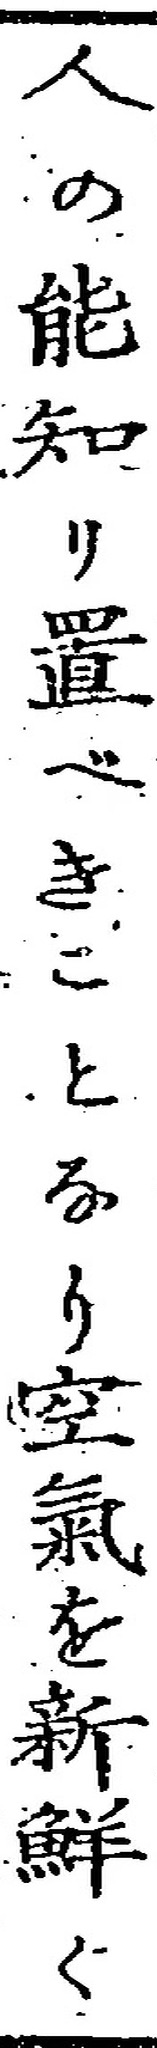人の能知り置べきことなり空気を新鮮く
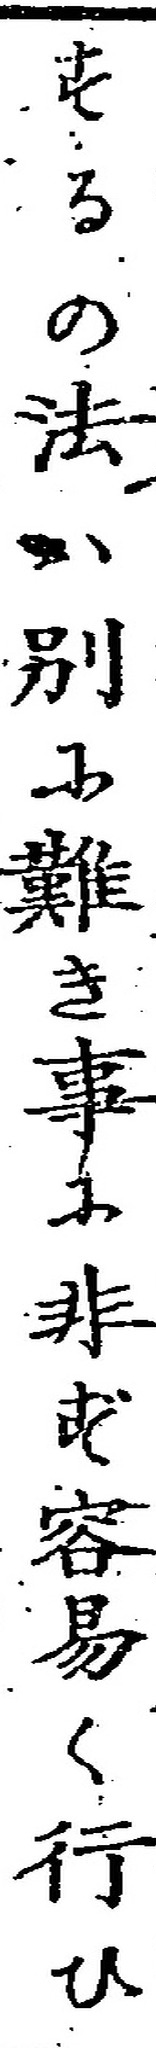するの法は別に難き事に非ず容易く行ひ
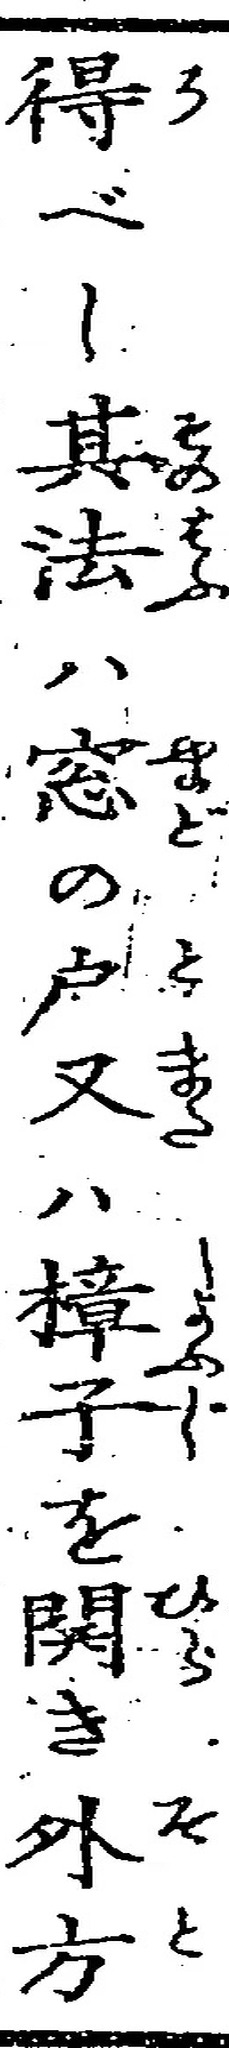得べし其法は窓の戸又は樟子を開き外方
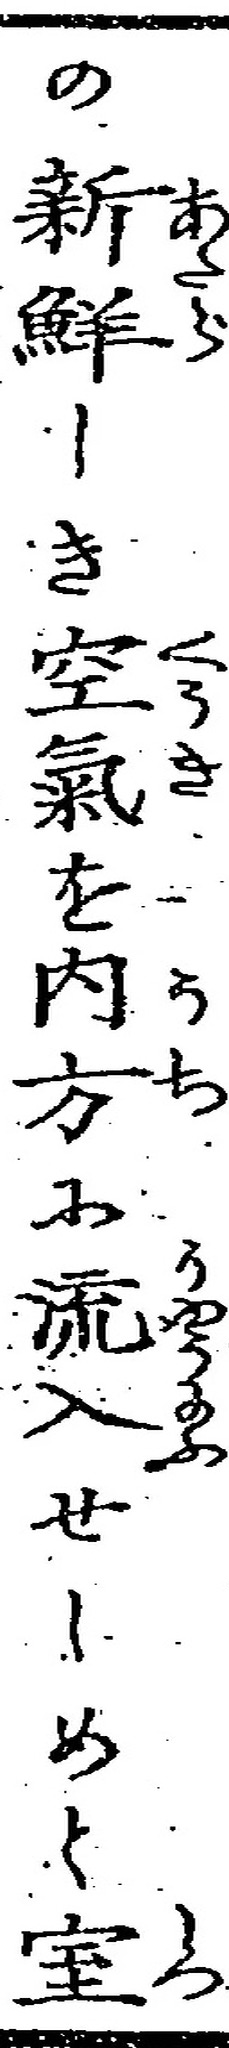の新鮮しき空気を内方に流入せしめと室
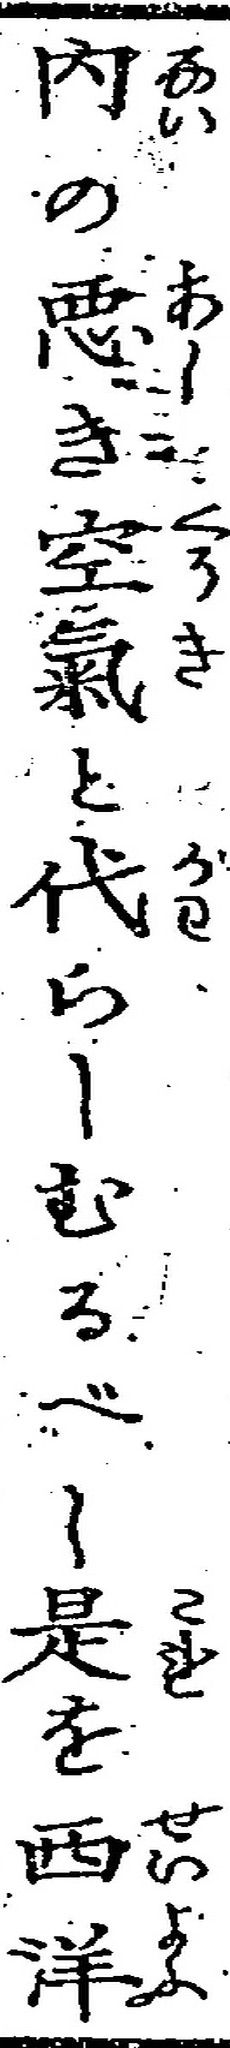内の悪き空気と代らしむるべし是を西洋
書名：コレラ予防命乃後見
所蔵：国立国会図書館 National Diet Library, JAPAN
